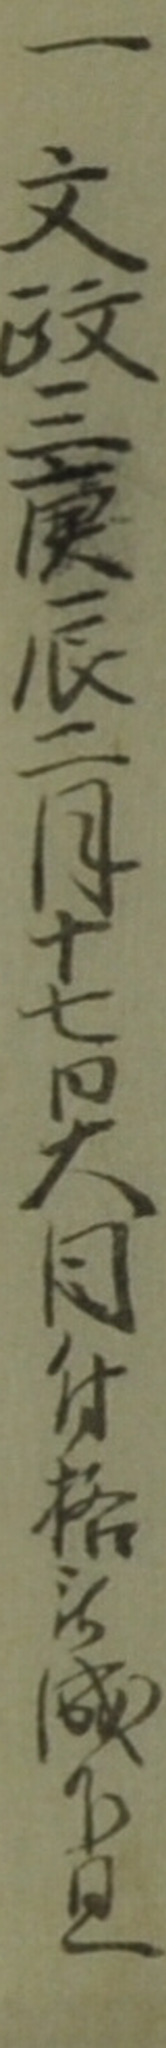一文政三庚辰二月十七日大目付格被成下且
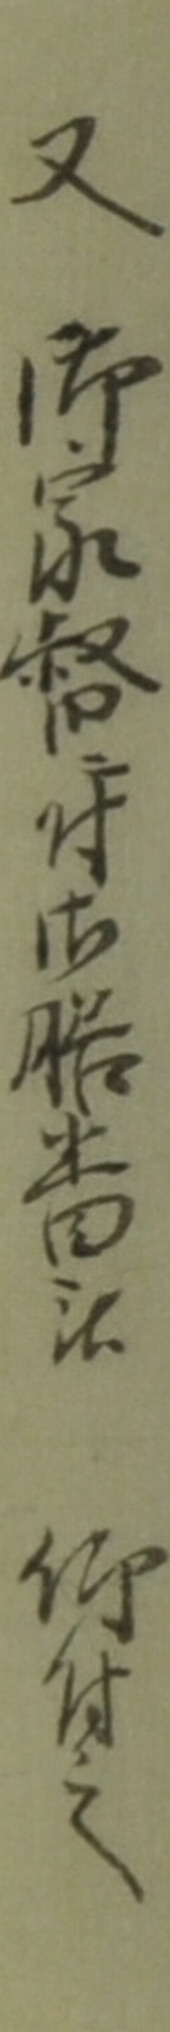又御家督ニ付御膳番被仰付之

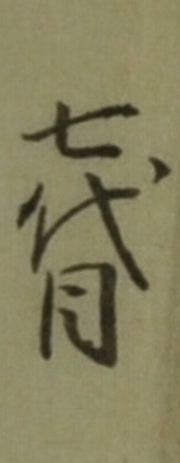七代目
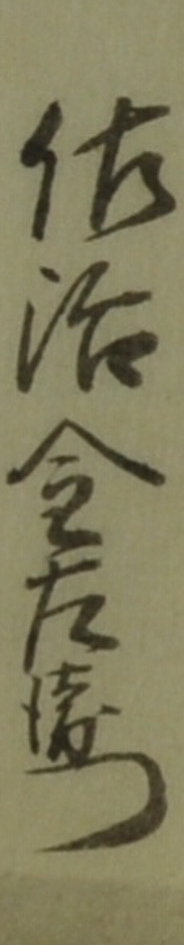佐治金左衛門
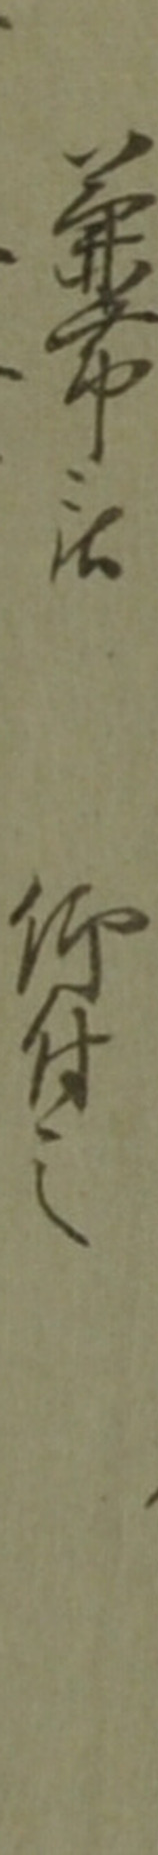兼帯被仰付之
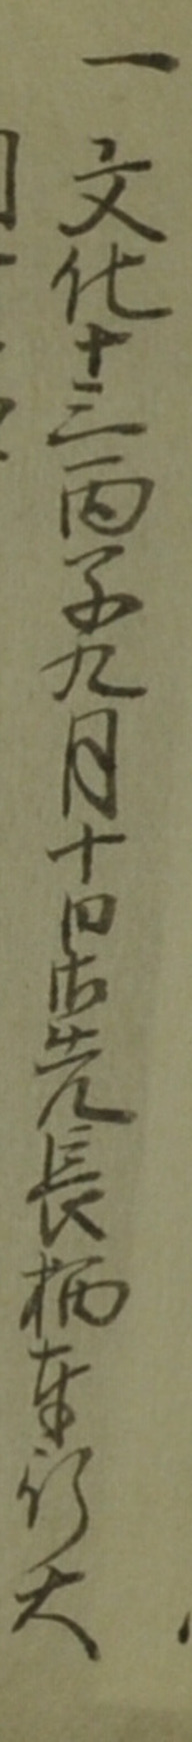一文化十三丙子九月十日御先長柄奉行大
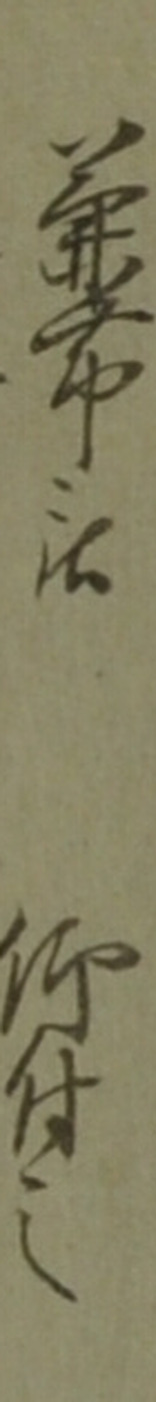兼帯被仰付之
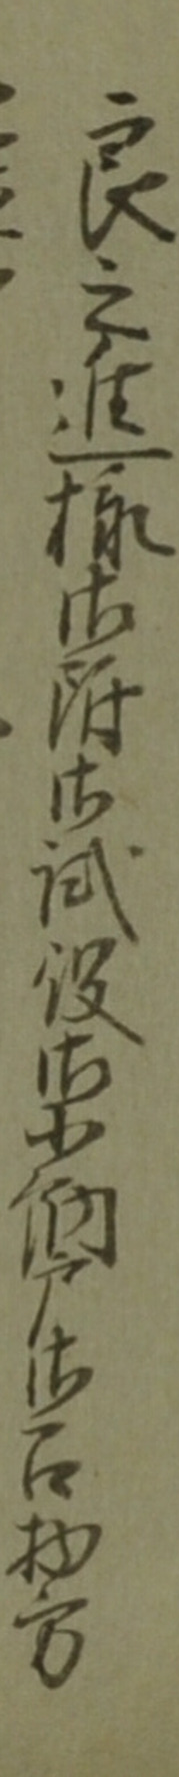良之進様御附御試役御小納戸御召物方
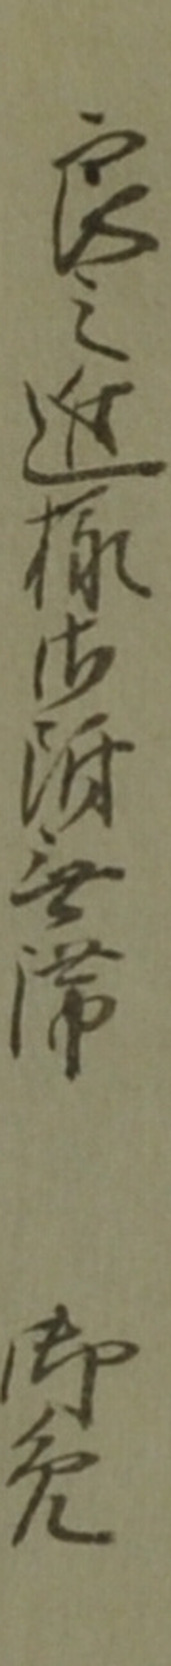良之進様御附無滞御免
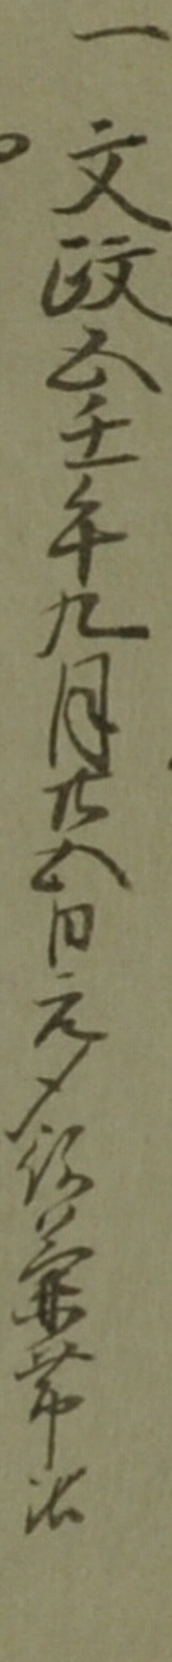一文政五壬午九月廿五日元〆役兼帯被
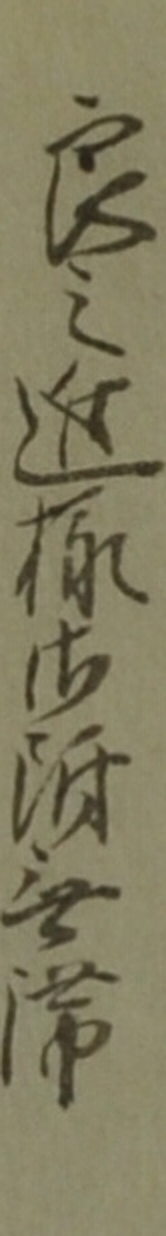良之進様御附無滞御免
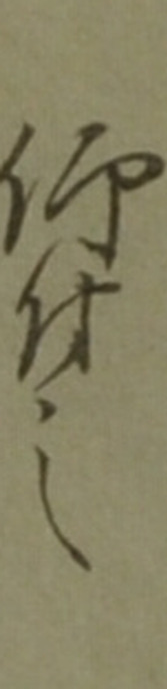仰付之
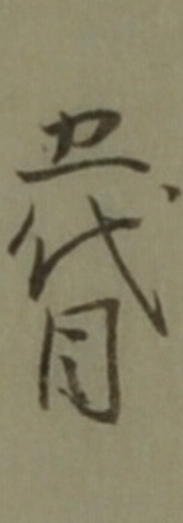五代目
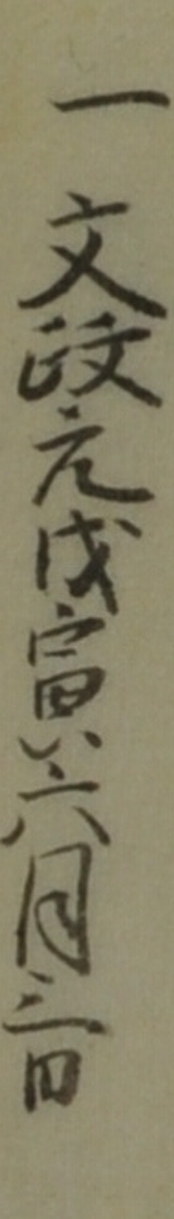一文政元戌寅六月三日
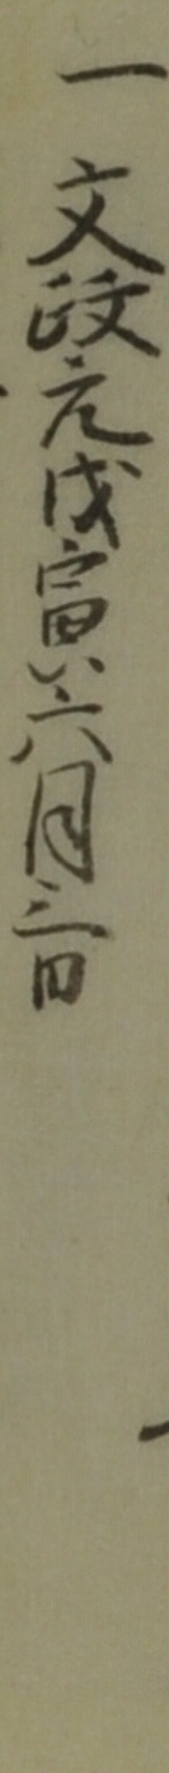一文政元戌寅六月三日
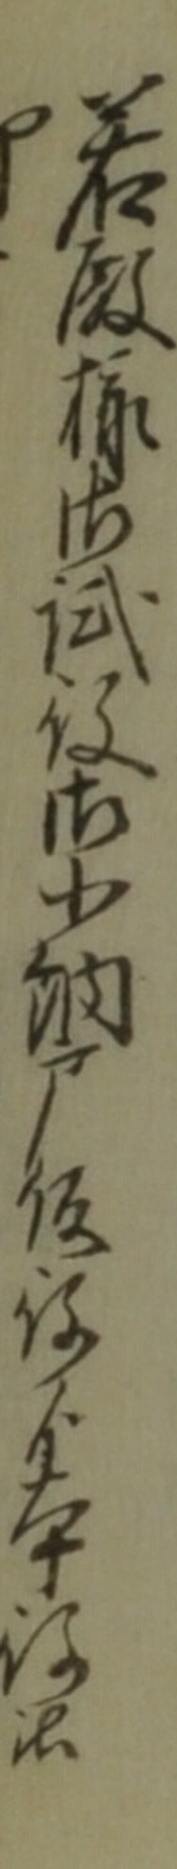若殿様御試役御小納戸仮役ゟ本役被
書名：諸御役代々録（四）
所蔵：伊那市立高遠町図書館・合同会社AMANE
